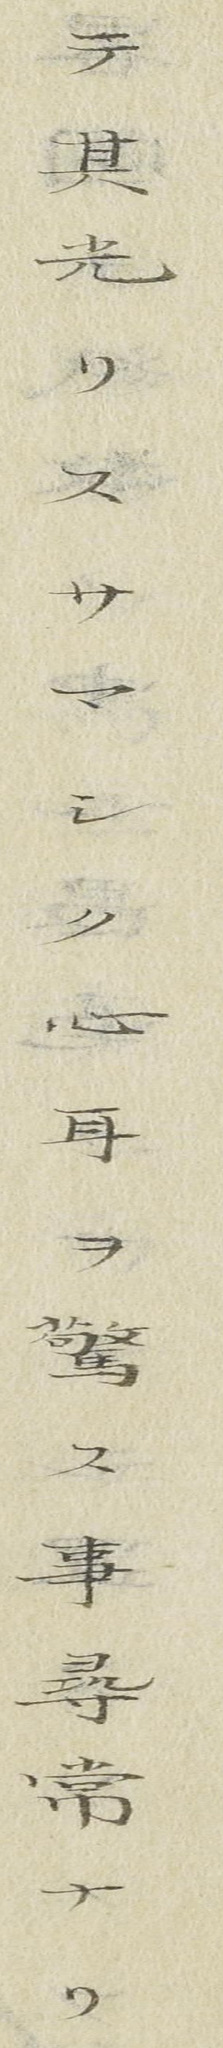テ其光リスサマシク心耳ヲ驚ス事尋常ナリ
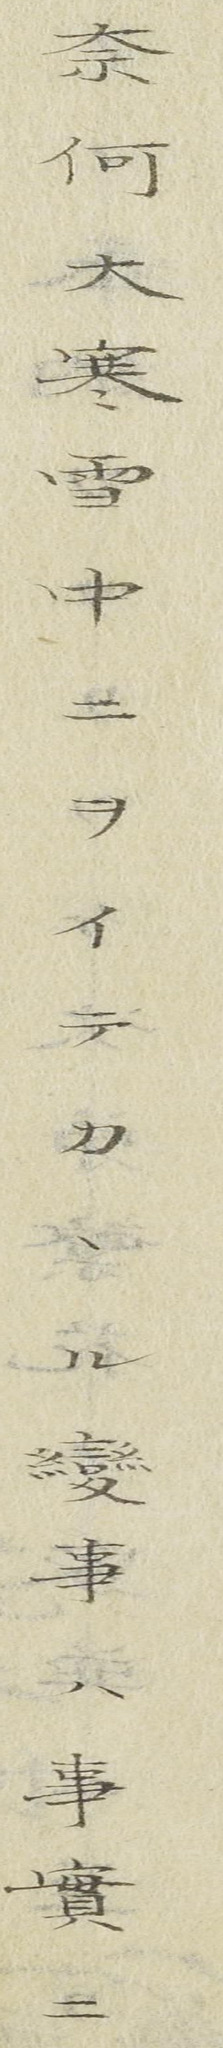奈何大寒雪中ニヲイテカヽル変事ハ事実ニ
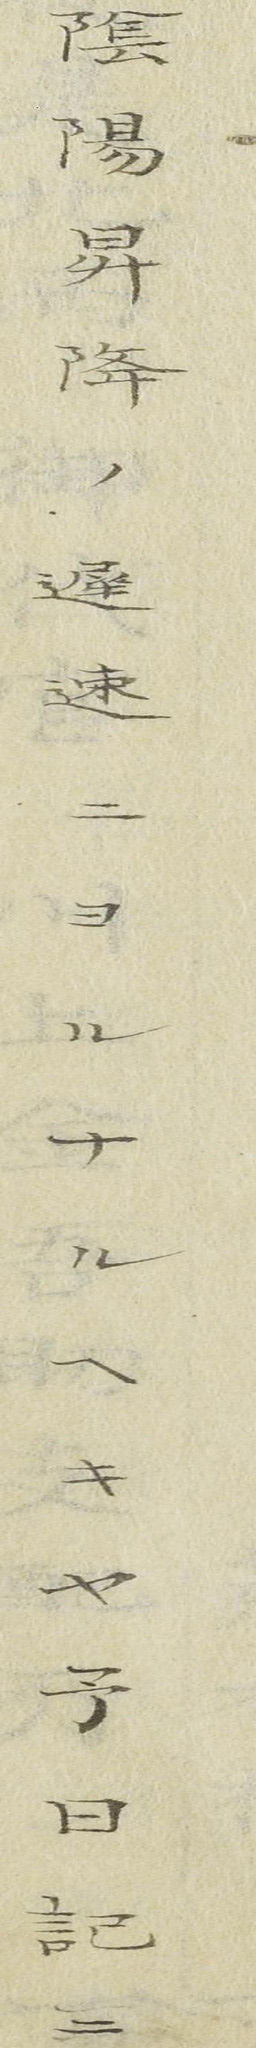陰陽昇降ノ遅速ニヨルナルヘキヤ予日記ニ
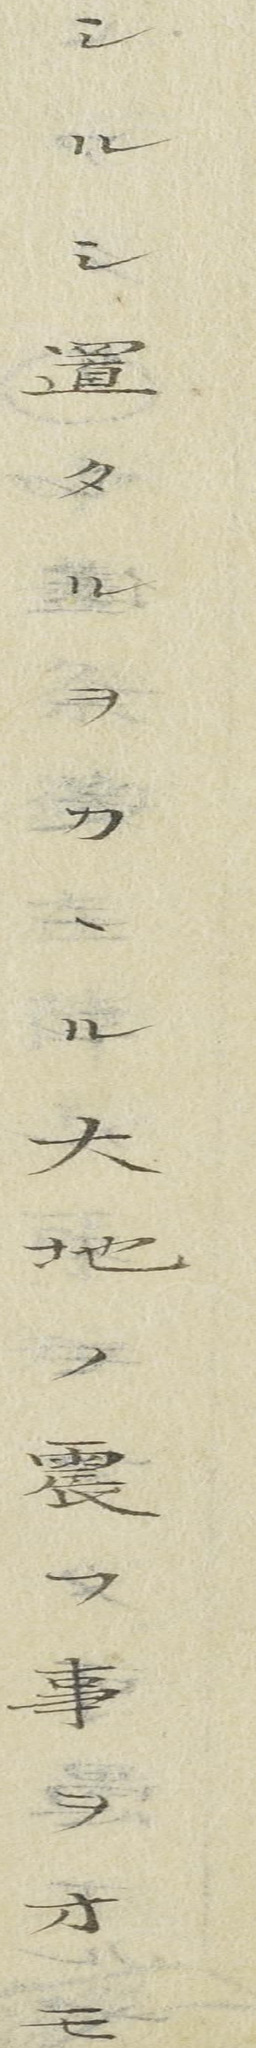シルシ置タルヲカヽル大地ノ震フ事ヲオモ

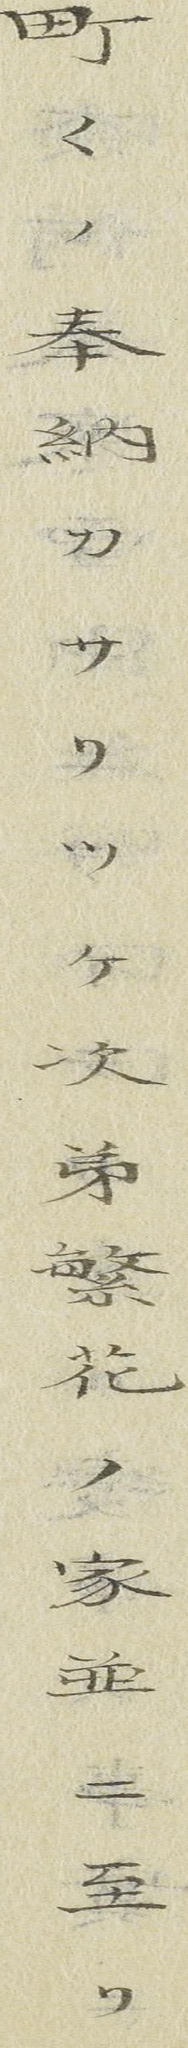町〱ノ奉納カサリツケ次第繁花ノ家並ニ至リ
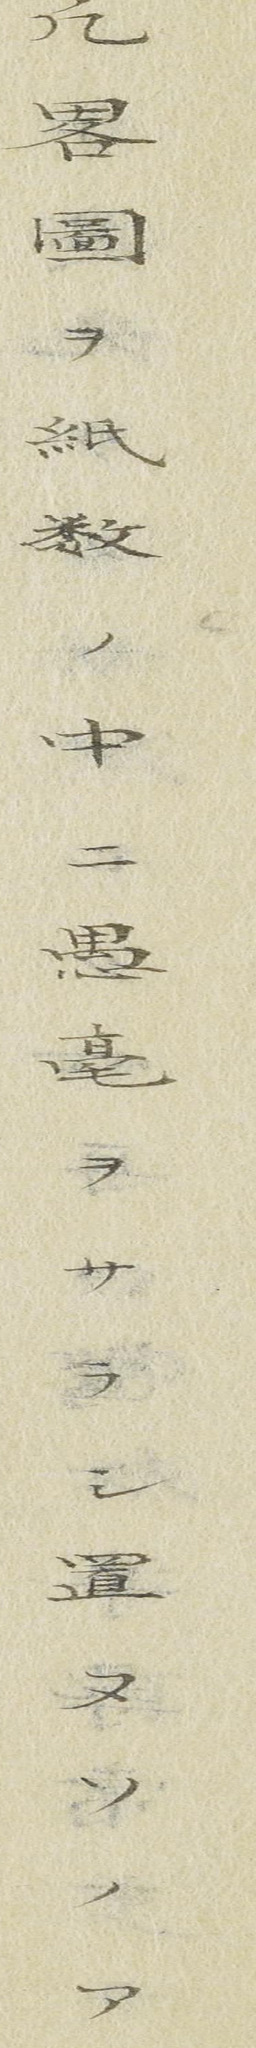凡略図ヲ紙数ノ中ニ愚毫ヲサラシ置ヌソノア
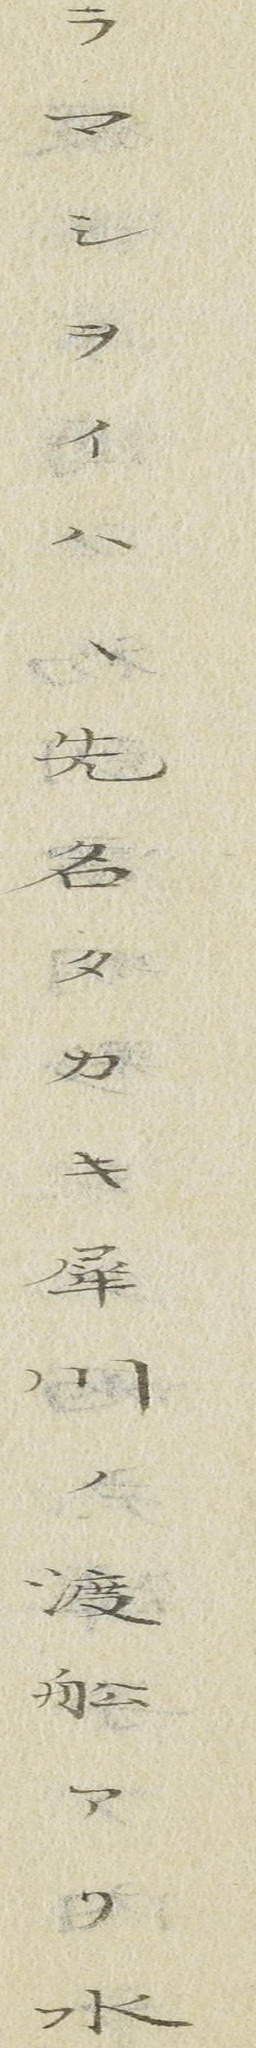ラマシヲイハヽ先名タカキ犀川ノ渡船アリ水
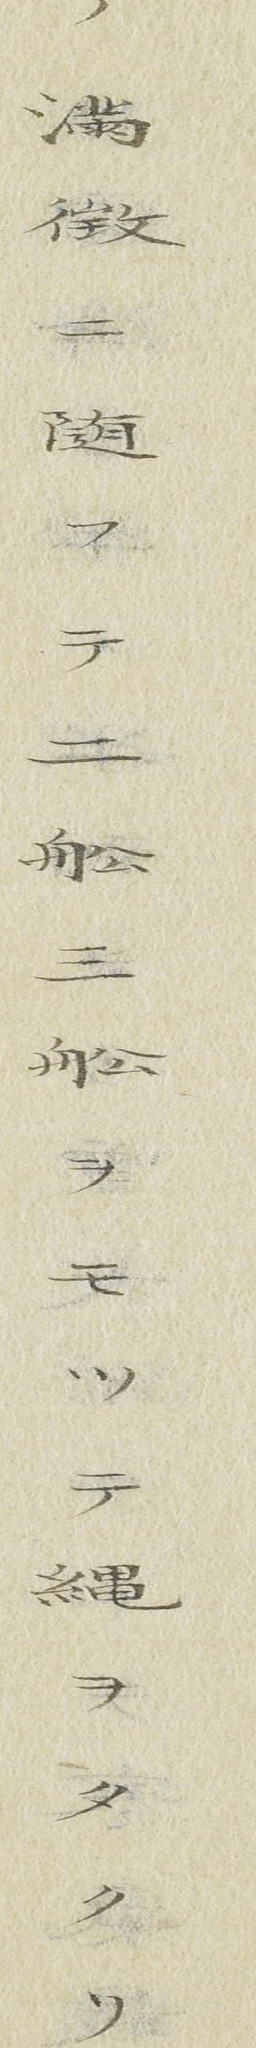ノ満微ニ随フテニ船三船ヲモツテ縄ヲタクリ
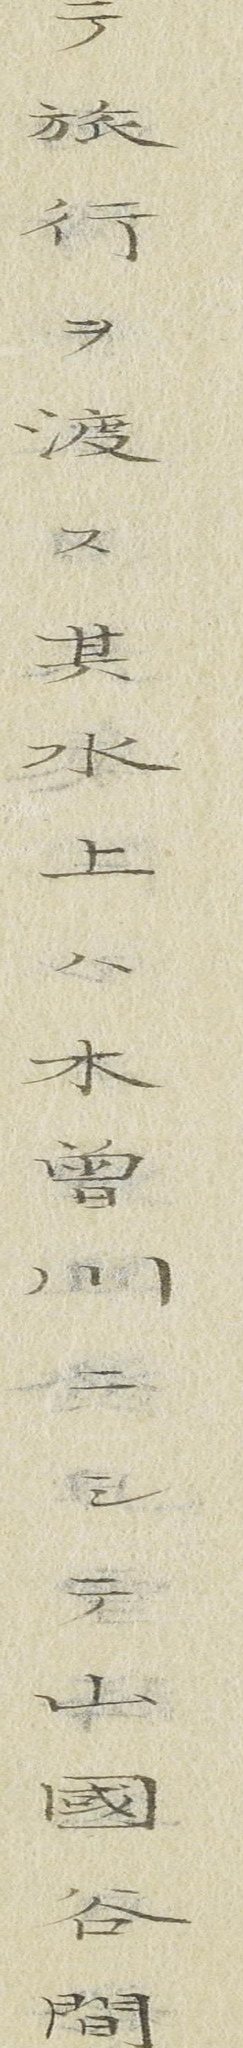テ旅行ヲ渡ス其水上ハ木曽川ニシテ山国谷間
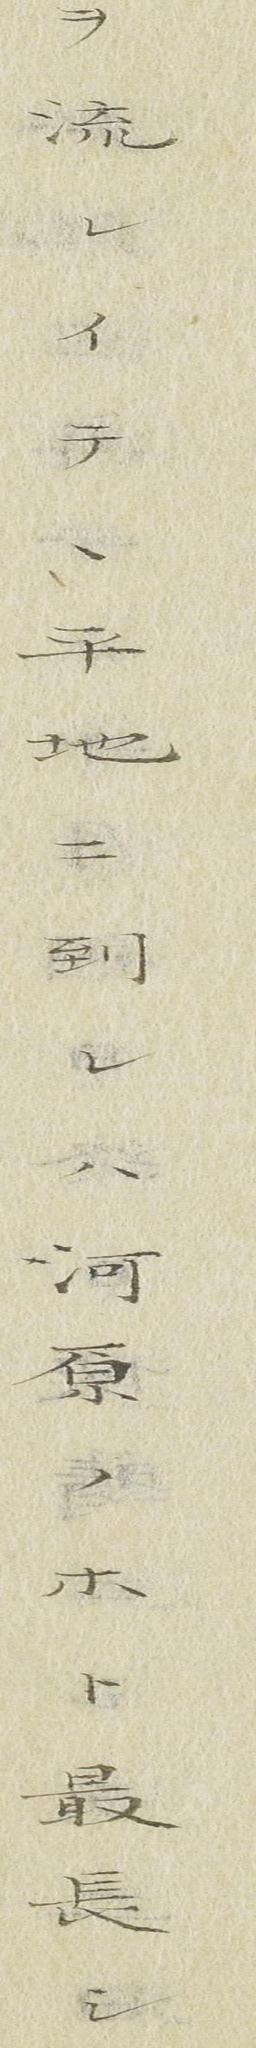ヲ流レイテヽ平地ニ到レハ河原ノホト最長シ
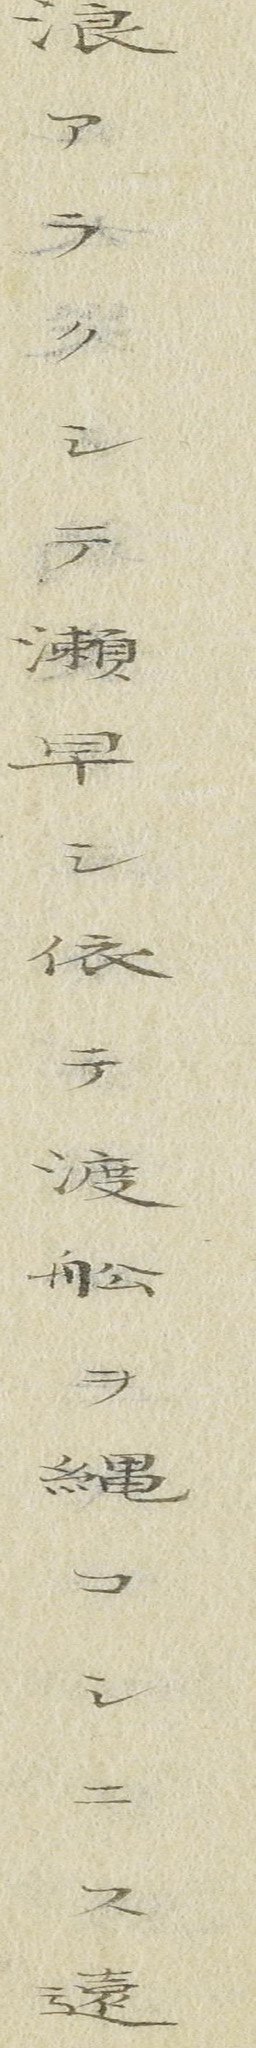浪アラクシテ瀬早シ依テ渡船ヲ縄コシニス遠
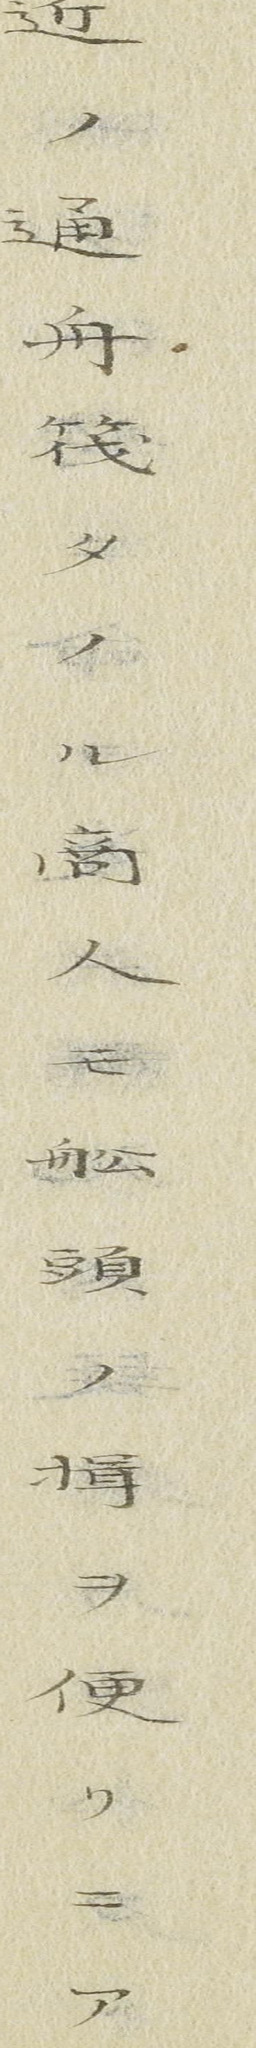近ノ通舟筏タノル商人モ船頭ノ揖ヲ便リニア
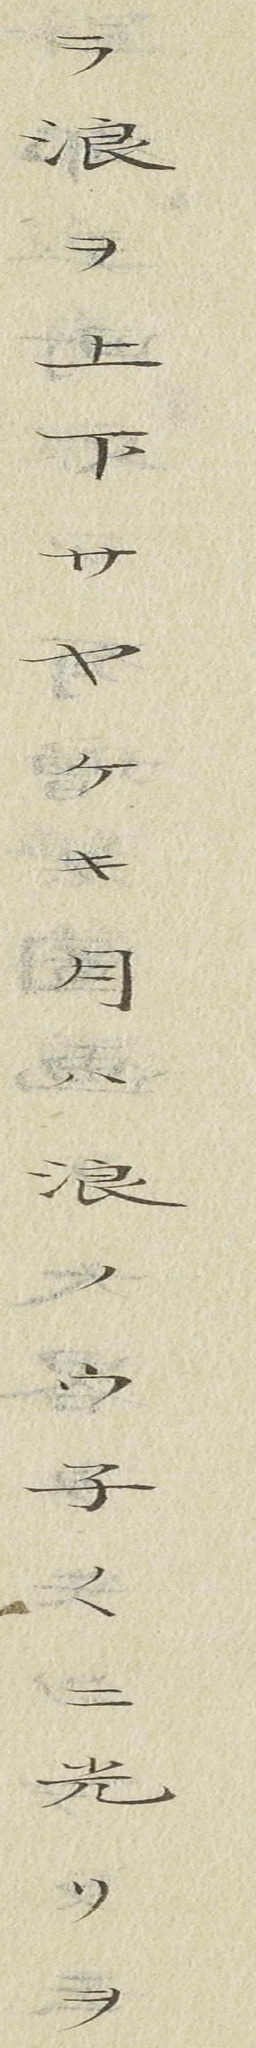ラ浪ヲ上下サヤケキ月ハ浪ノウ子〱ニ光リヲ
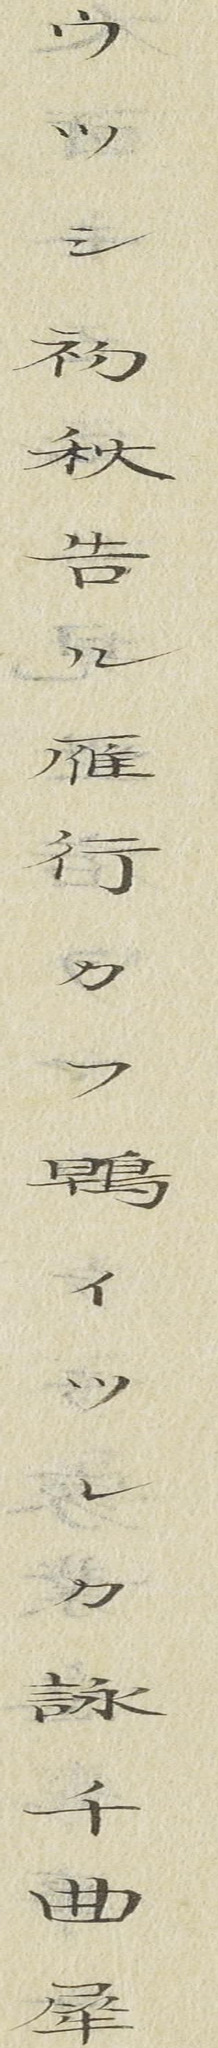ウツシ初秋告ル雁行カフ鴨？イツレカ詠千曲犀
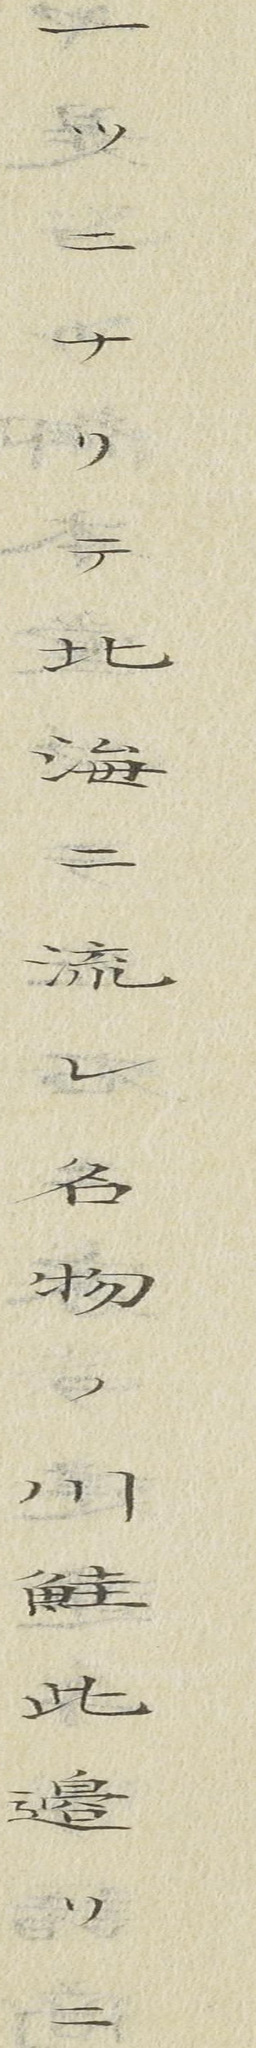一ツニナリテ北海ニ流レ名物ノ川鮭此辺リニ
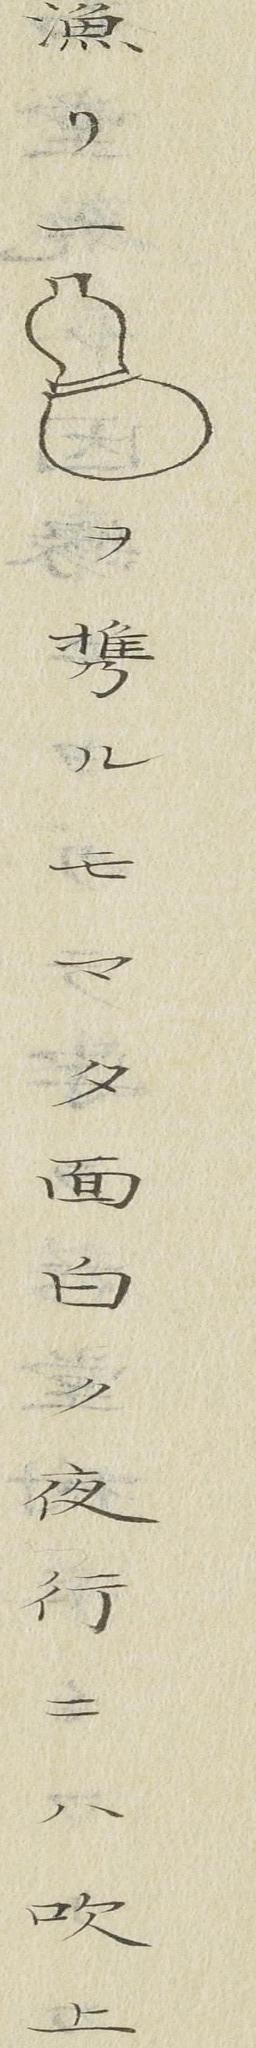漁リ一ヲ携ルモマタ面白ク夜行ニハ吹上
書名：地災撮要　地震之部　巻ノ二
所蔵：東京大学地震研究所図書室 Earthquake Research Institute Library, The University of Tokyo, JAPAN
